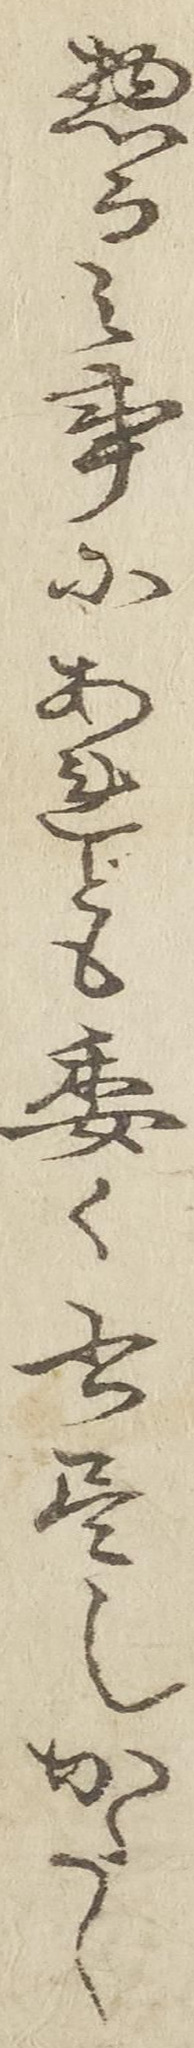惣而之事にあれども委く書尽しかたし

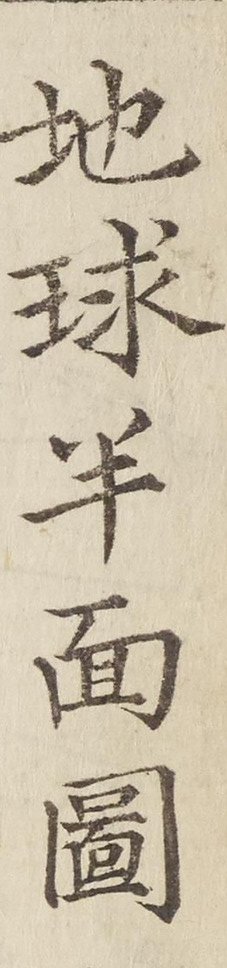地球半面図

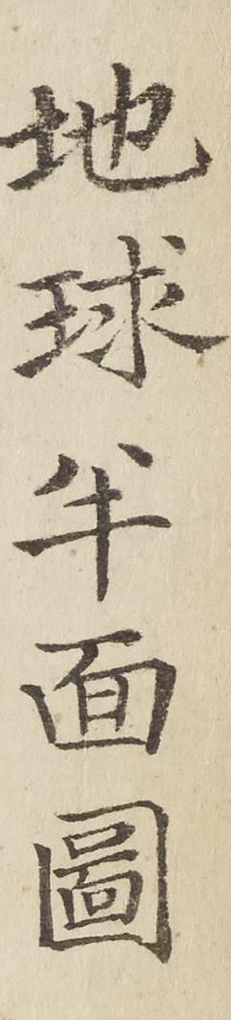地球半面図

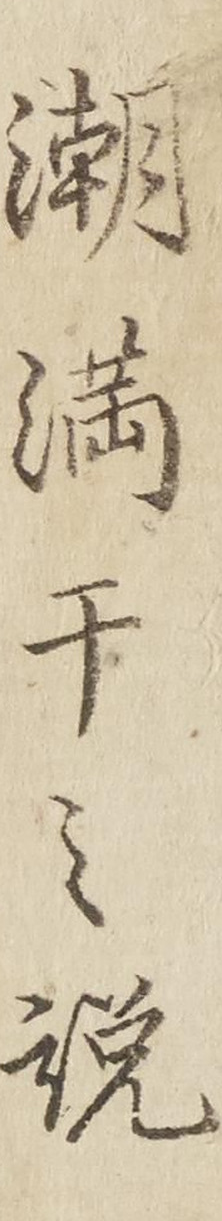潮満干之説
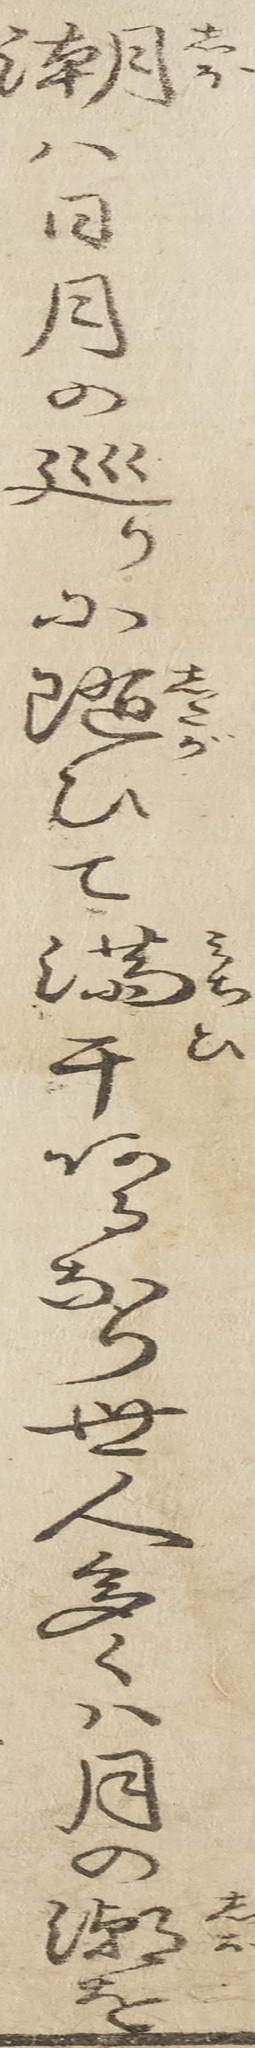潮は日月の巡りに随ひて満干あるなり世人多くは月の潮を
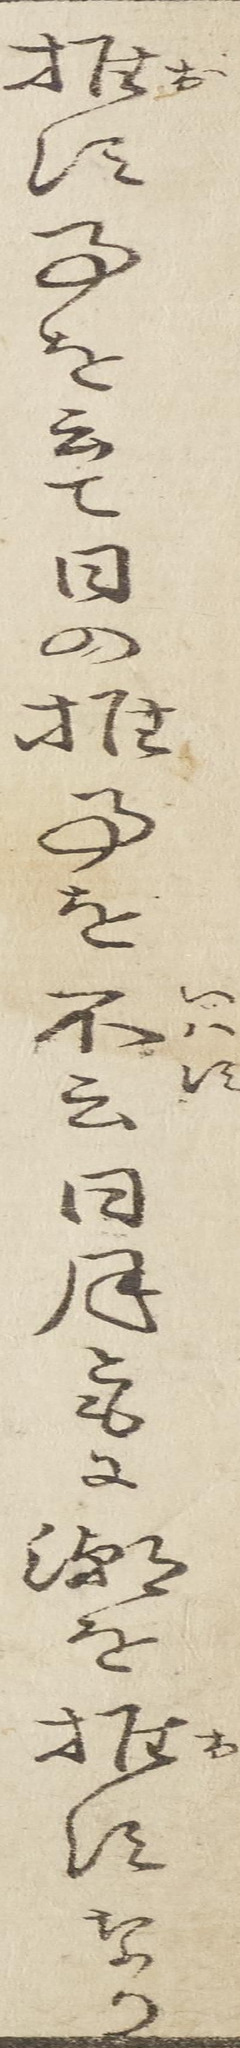推す事を云て日の推事を不云日月ともに潮を推すなり
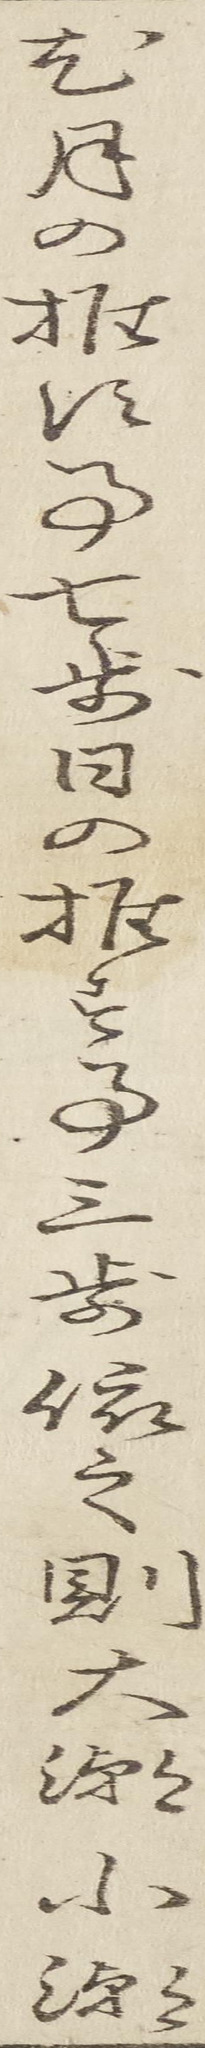尤月の推す事七歩日の推す事三歩依之則大潮小潮
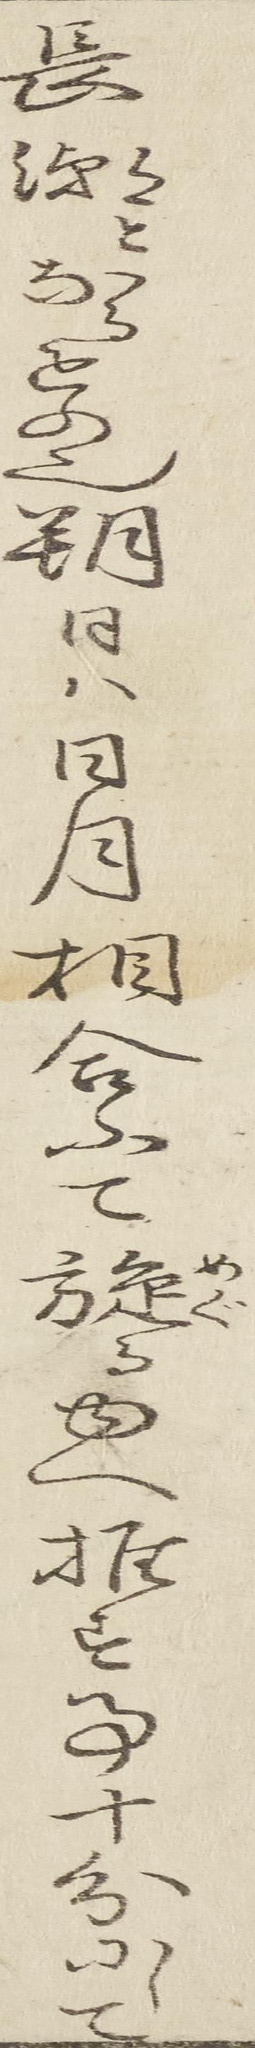長潮となるもの也朔日は日月相合ふて旋るゆへ推す事十分にして
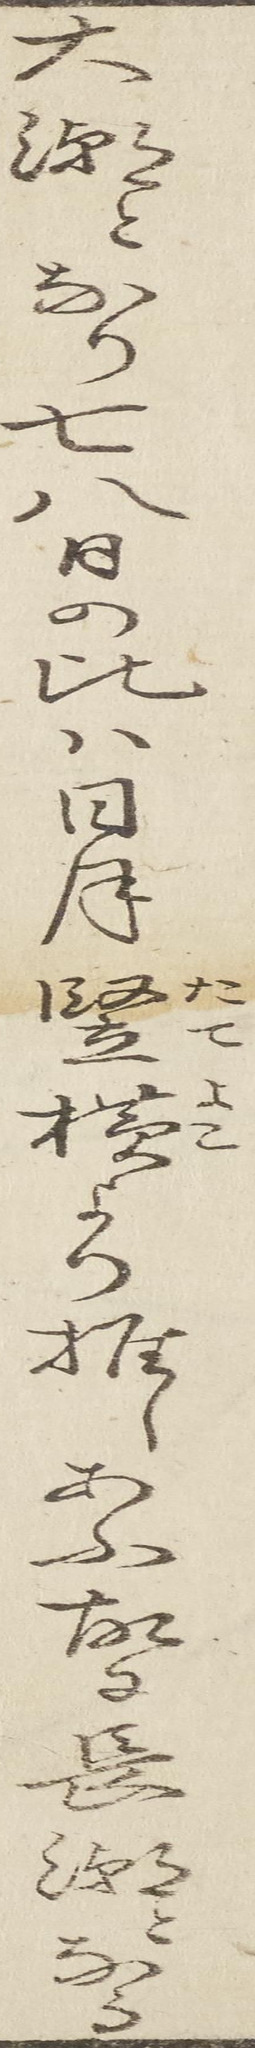大潮となり七八日の比は日月竪横より推しあふ故に長潮となる
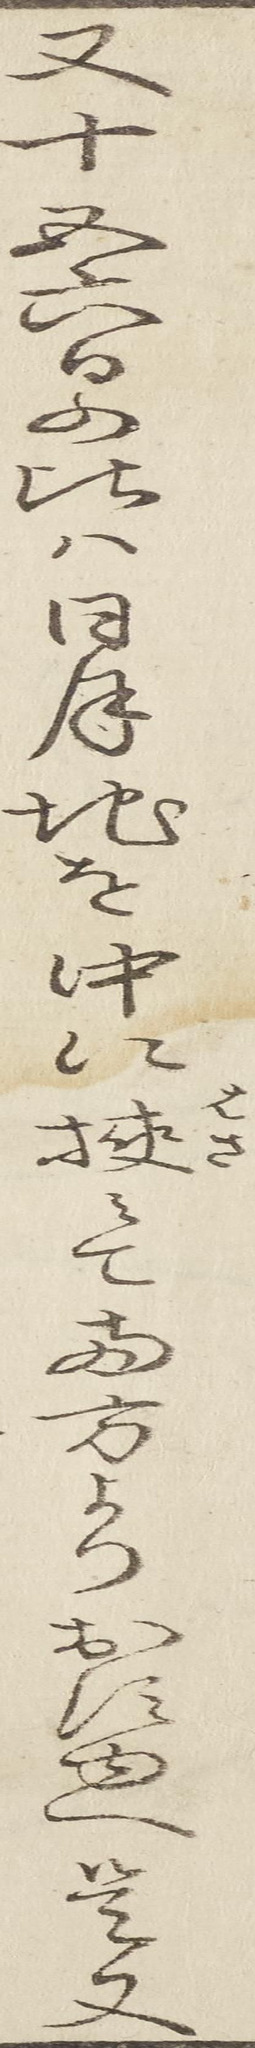又十五六日の比は日月地を中に挟みて両方よりおすゆへ是又
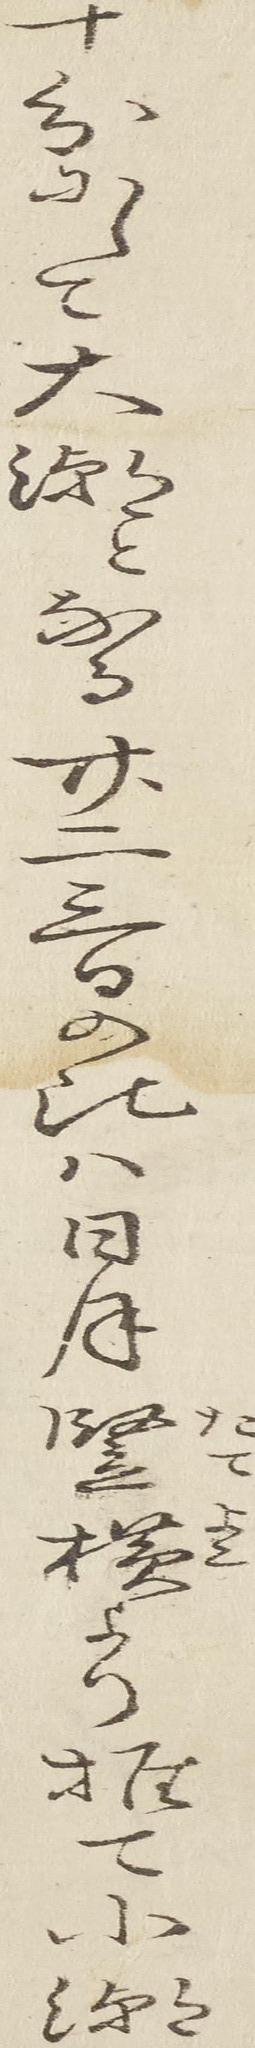十分にして大潮となる廿二三日の比は日月竪横より推て小潮
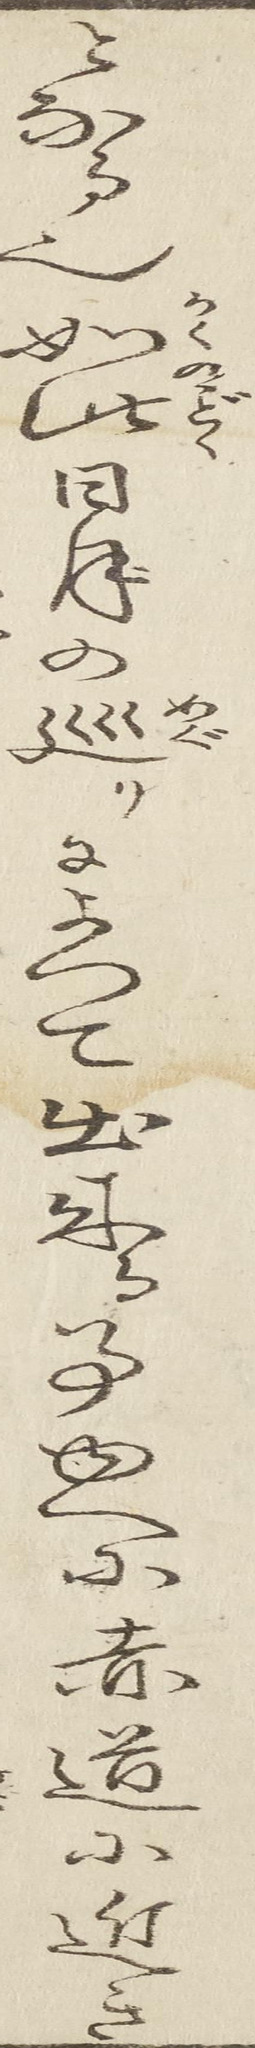となる也如此日月の巡りによつて出来る事ゆへに赤道に近き
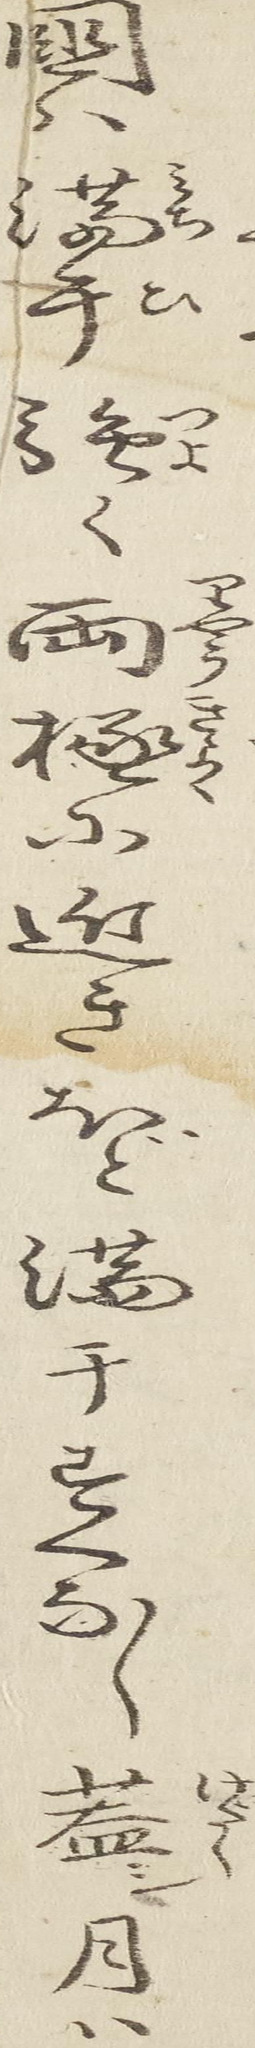国は満干強く両極に近きほど満干すくなし蓋シ月は
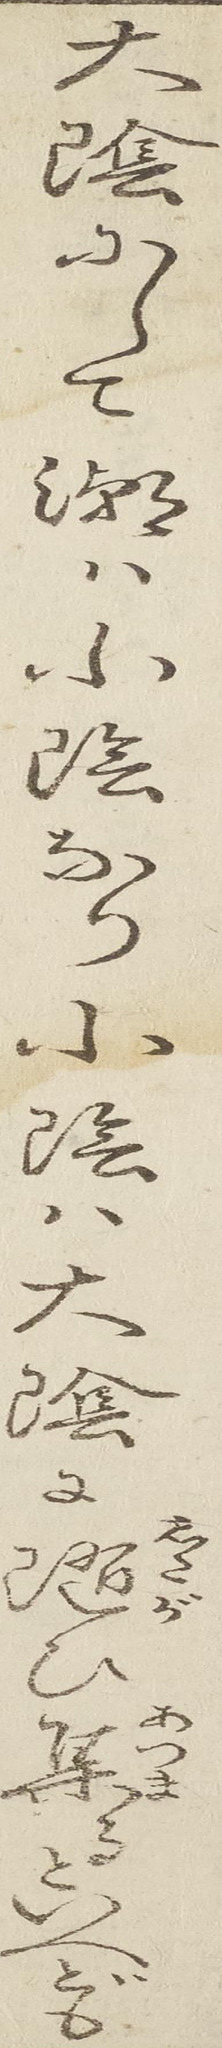大陰にして潮は小陰なり小陰は大陰に随ひ集るといへども
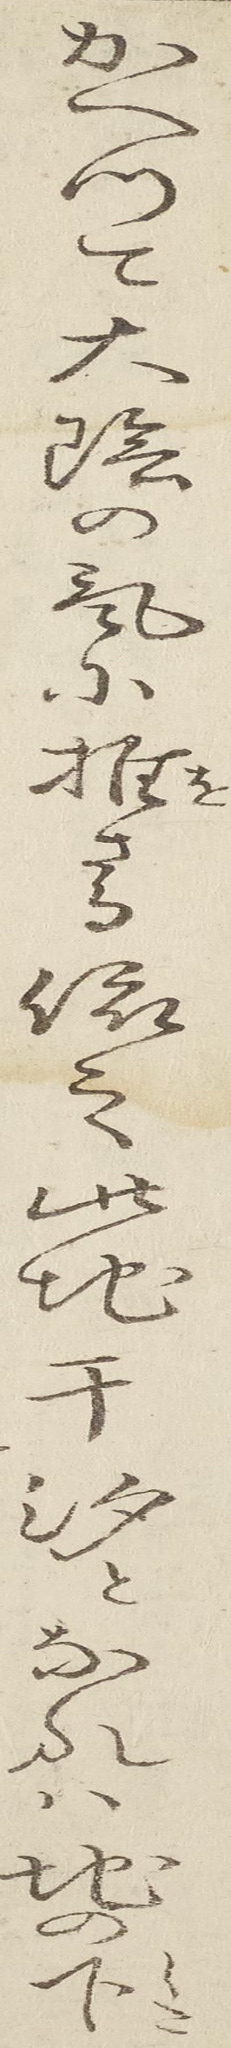かへつて大陰の気に推さる依之此地干汐となれは地の下
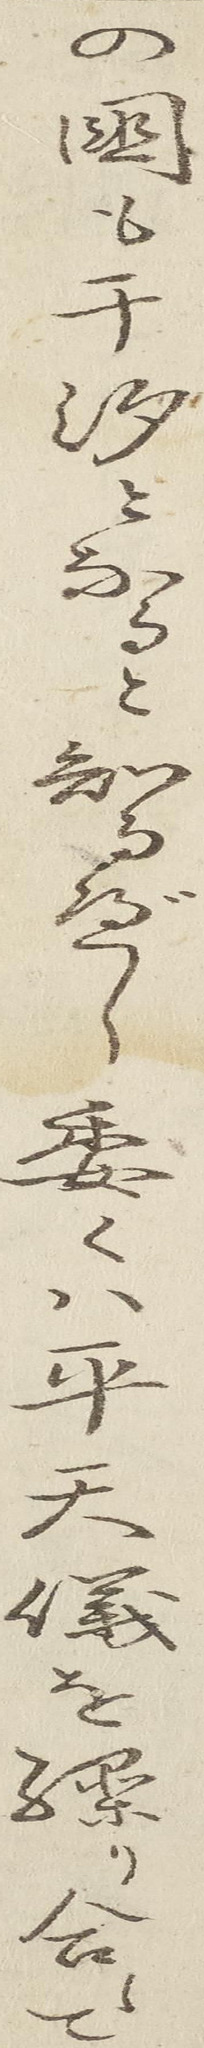の国も干汐となると知るべし委くは平天儀を繰り合して
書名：平天儀圖解
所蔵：東京大学地震研究所図書室 Earthquake Research Institute Library, The University of Tokyo, JAPAN
